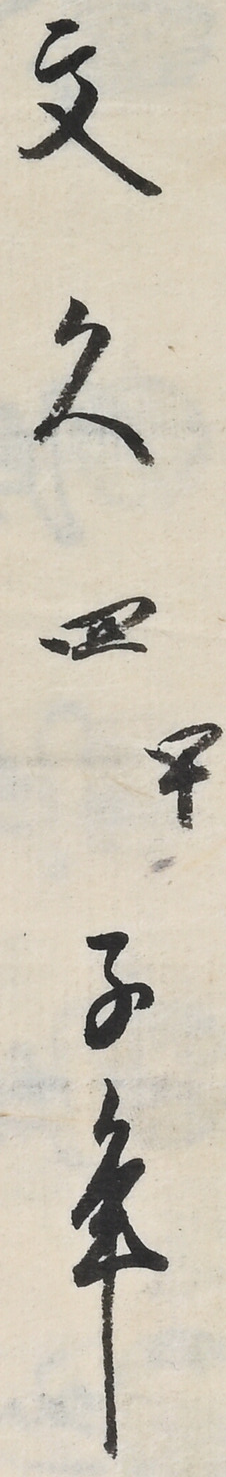文久四甲子年
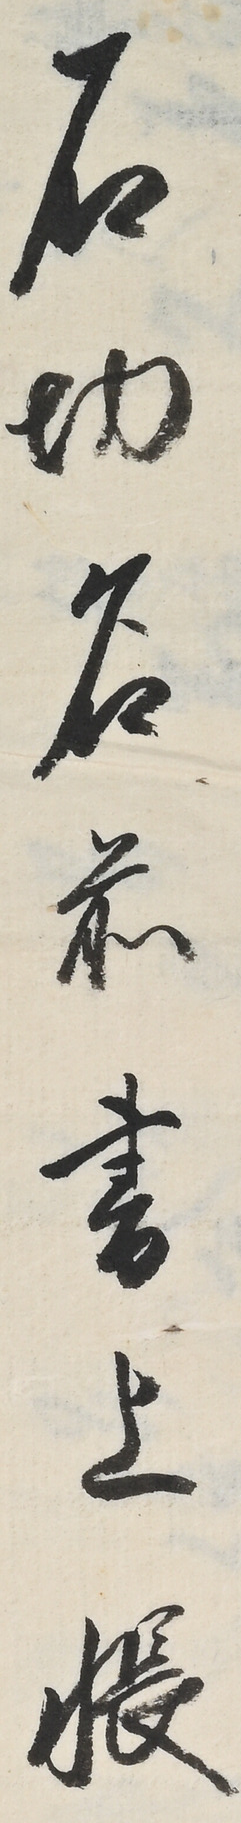石切名前書上帳
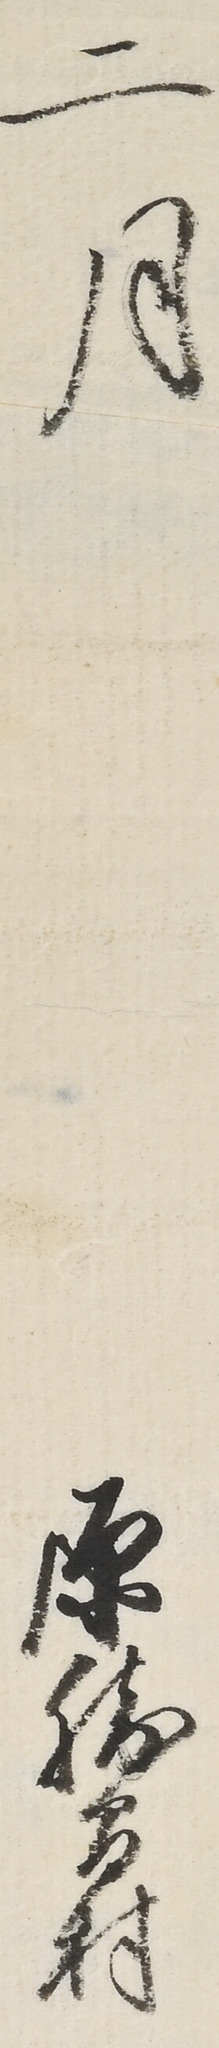二月原勝間村

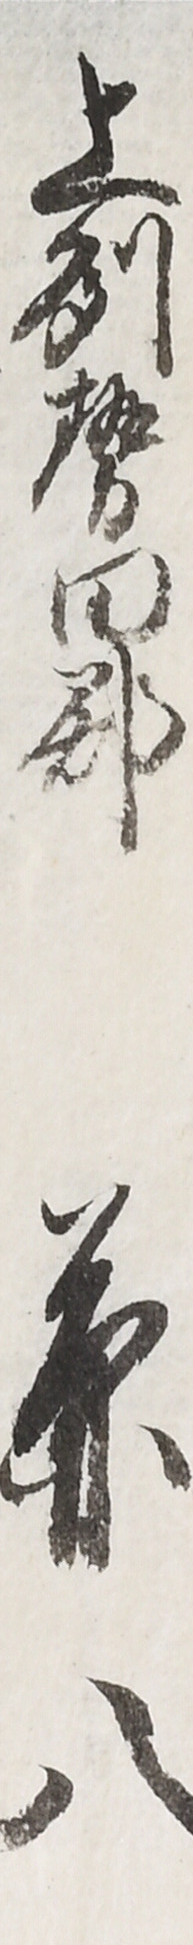上州勢田郡兼八

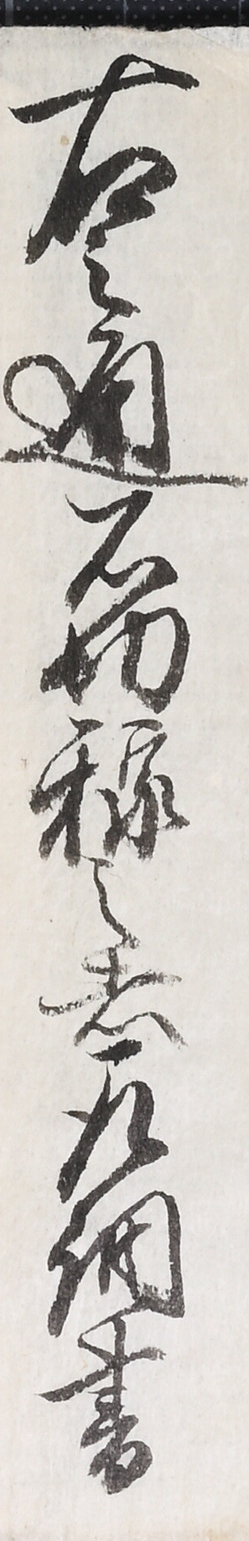右之通石切稼之者取調書
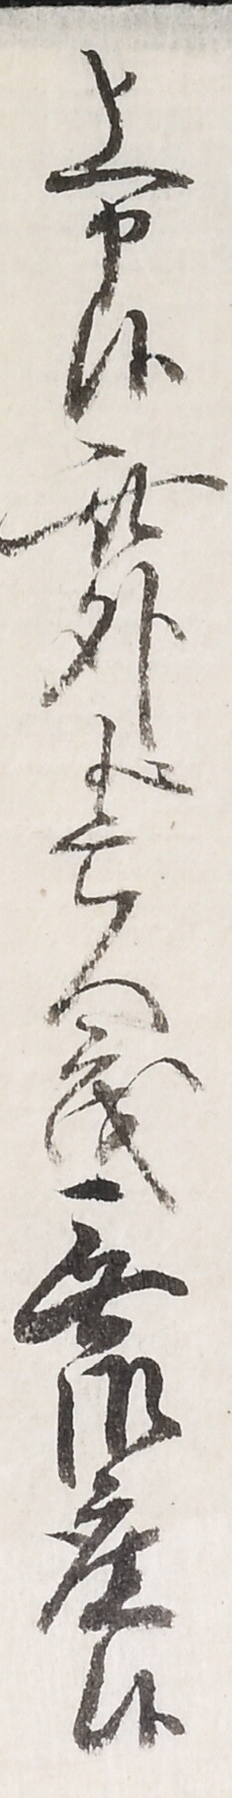上申候此外ニ壱人茂無御座候
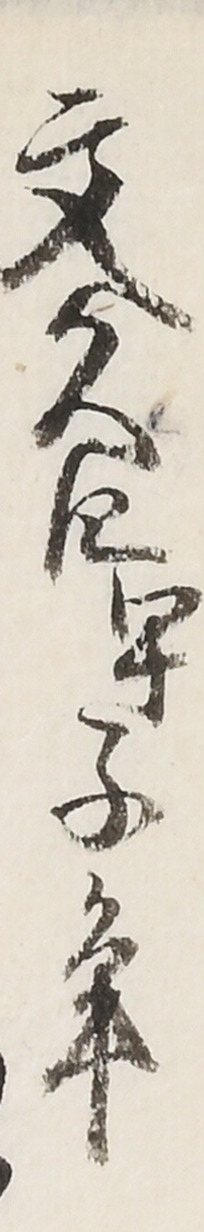文久四甲子年
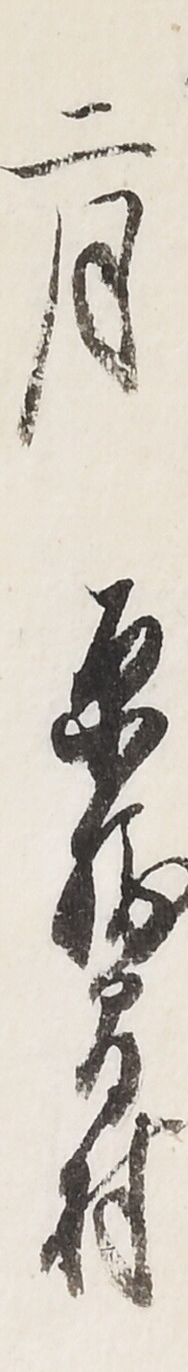二月原勝間村
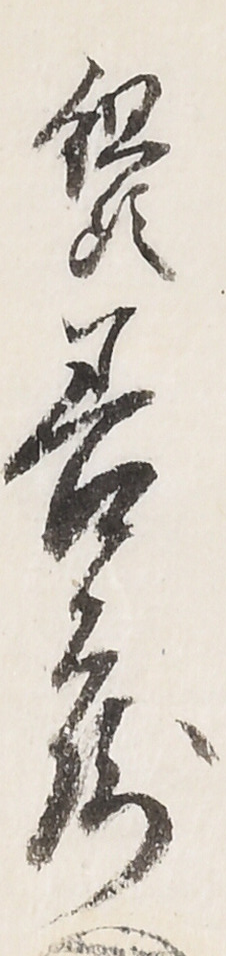組頭善蔵㊞
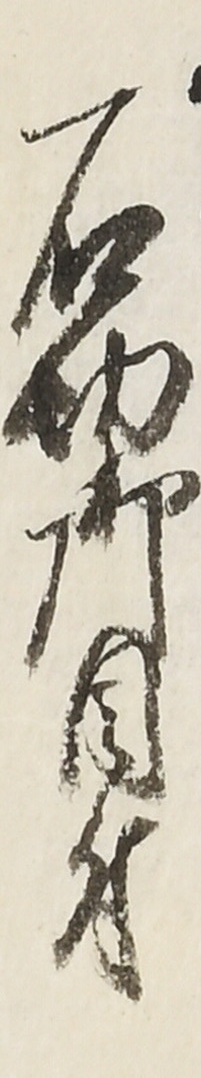石切御目付
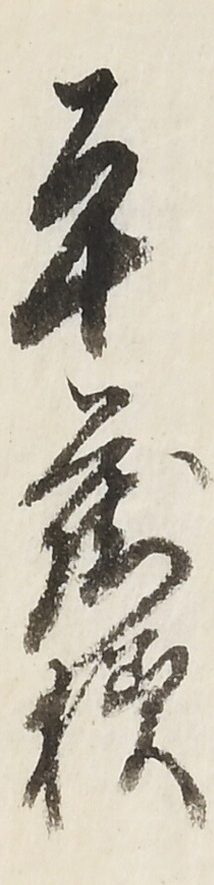平蔵様
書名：文久四甲子年二月石切名前書上帳
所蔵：伊那市立高遠町図書館・合同会社AMANE
